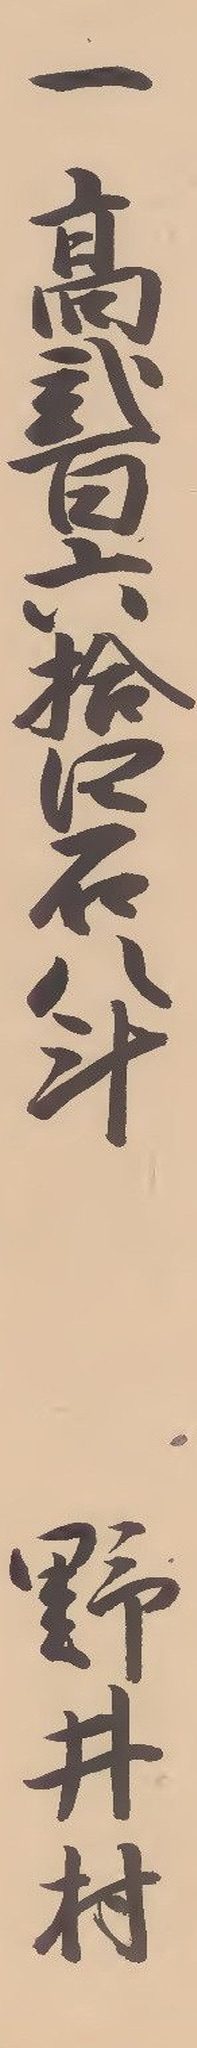一高弐百六拾四石八斗野井村

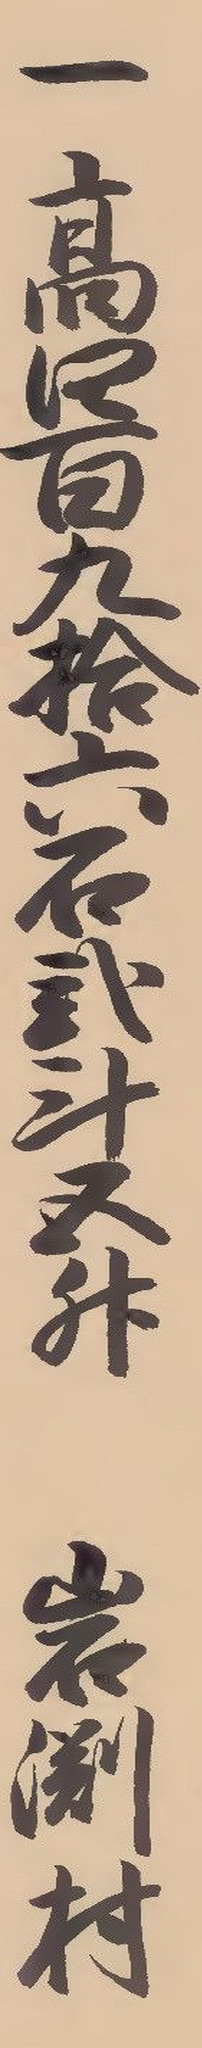一高四百九拾六石弐斗五升岩淵村
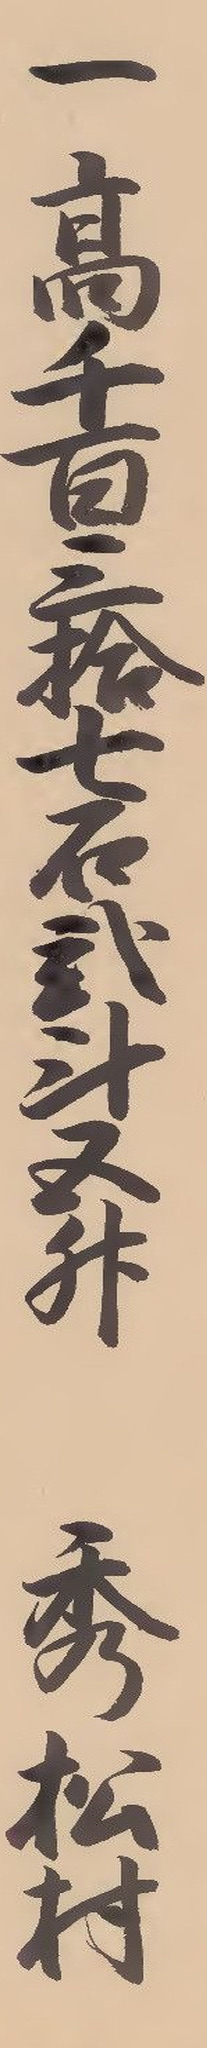一高千百三拾七石弐斗五升秀松村
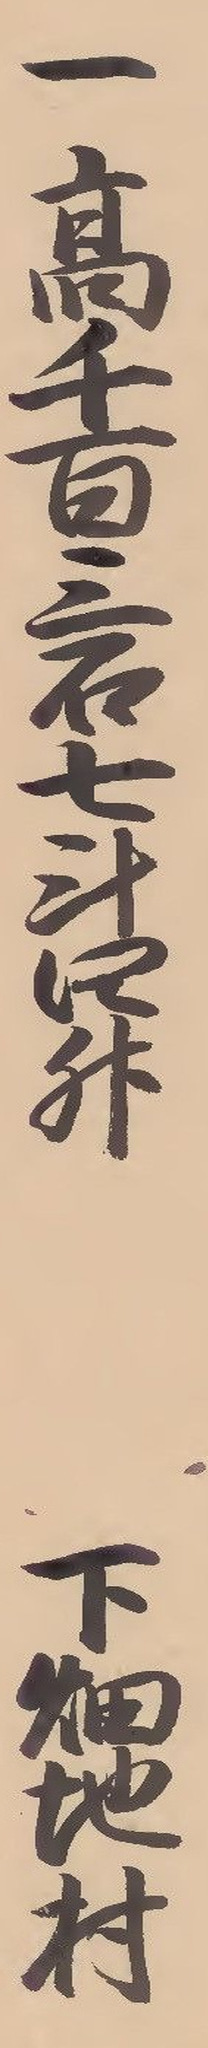一高千百三石七斗四升下畑地村

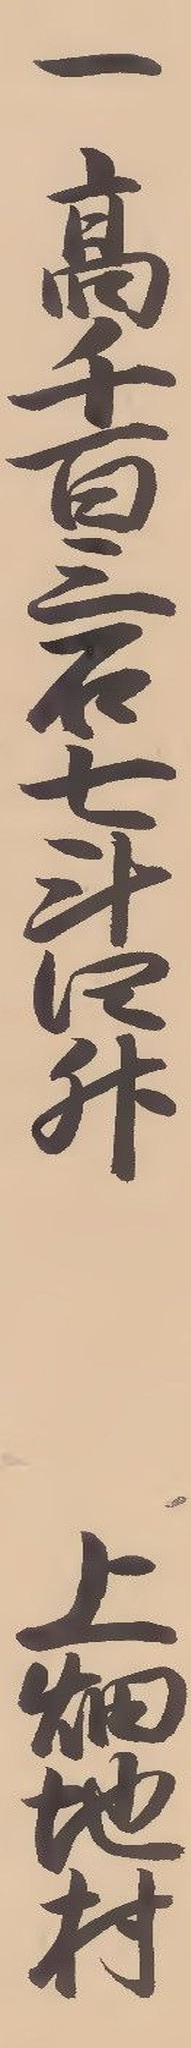一高千百三石七斗四升上畑地村
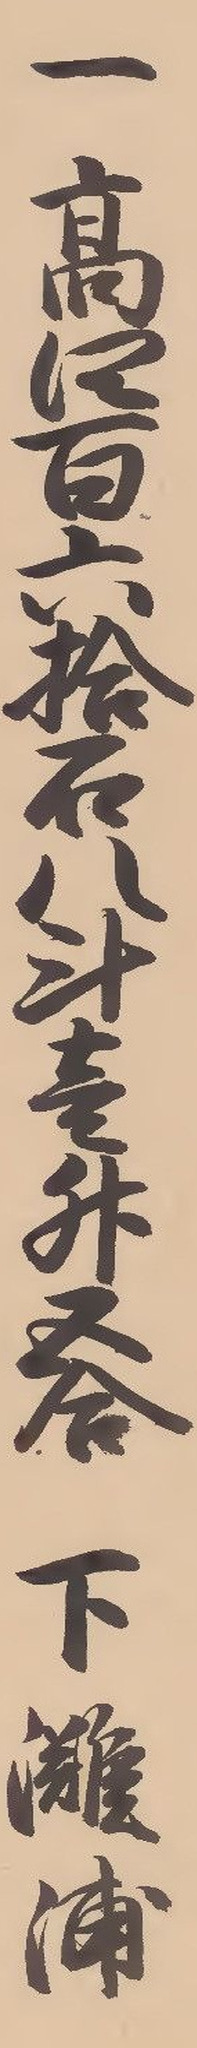一高四百六拾石八斗壱升五合下灘浦
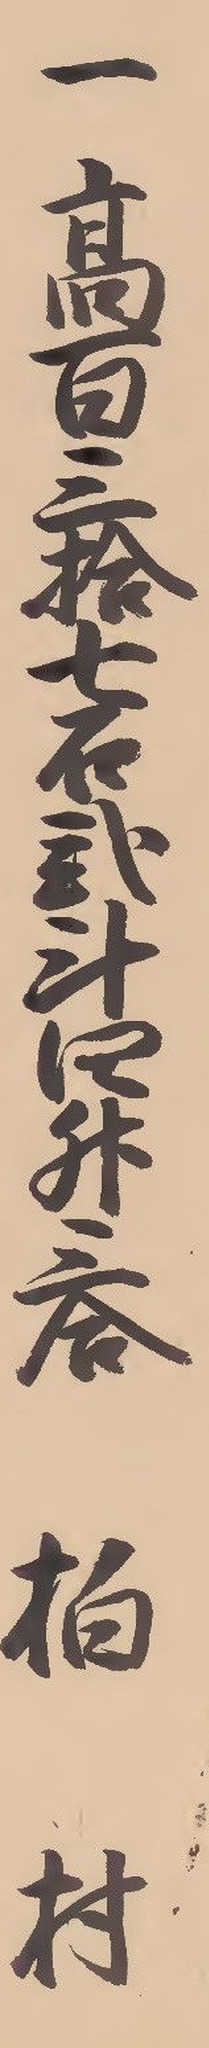一高百三拾七石弐斗四升三合柏村
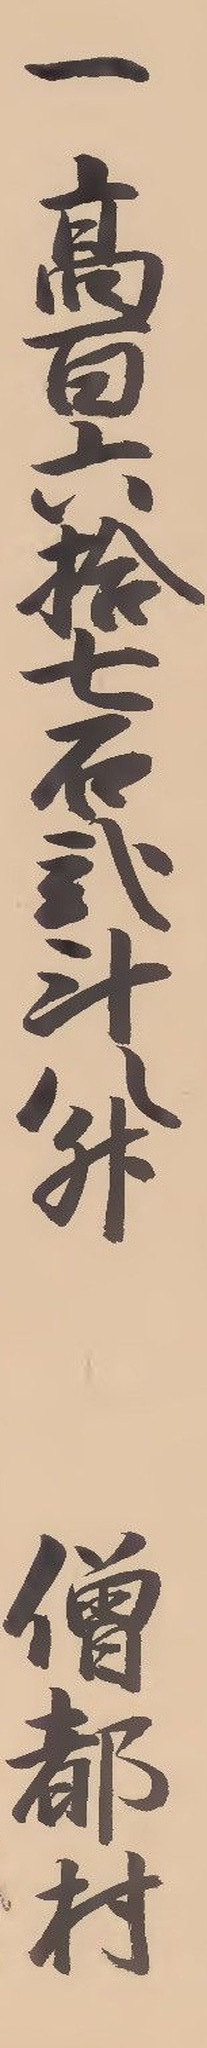一高百六拾七石弐斗八升僧都村
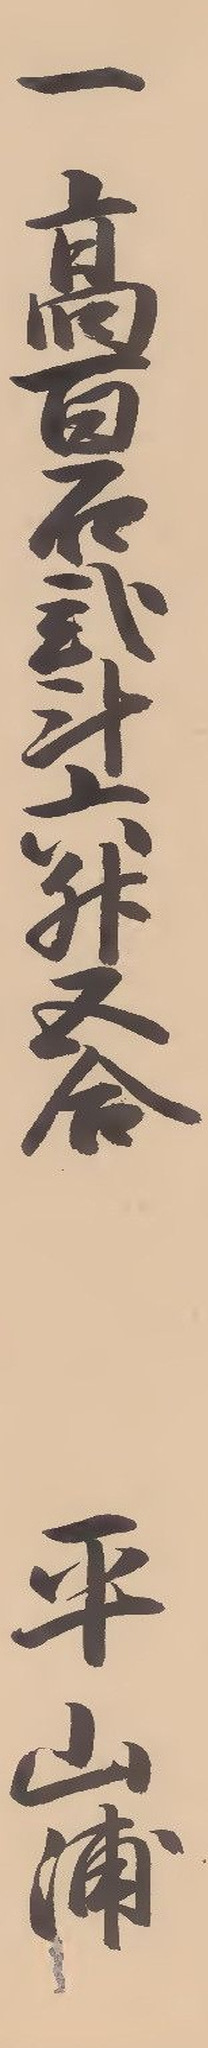一高百石弐斗六升五合平山浦
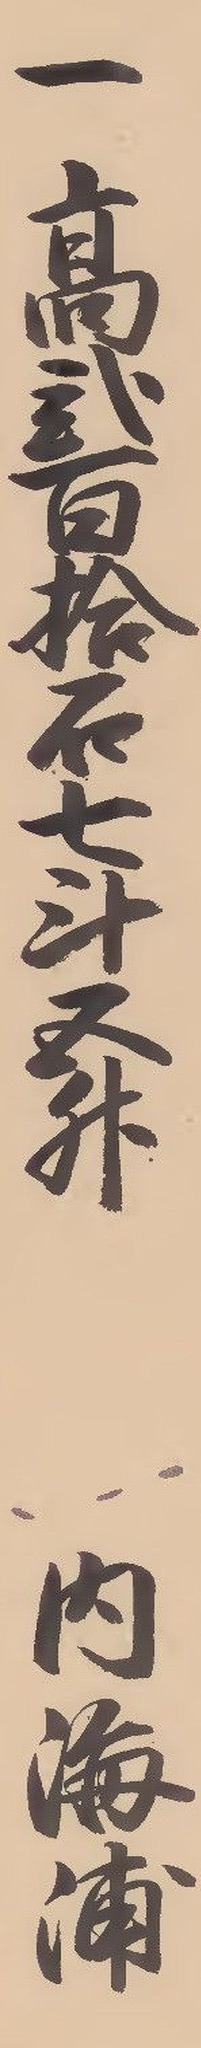一高弐百拾石七斗五升内海浦

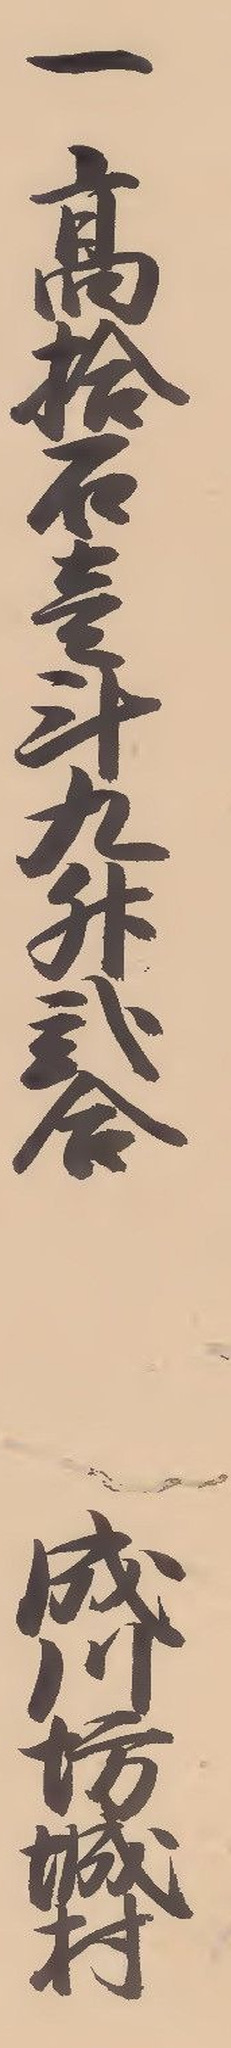一高拾石壱斗九升弐合成川坊城村
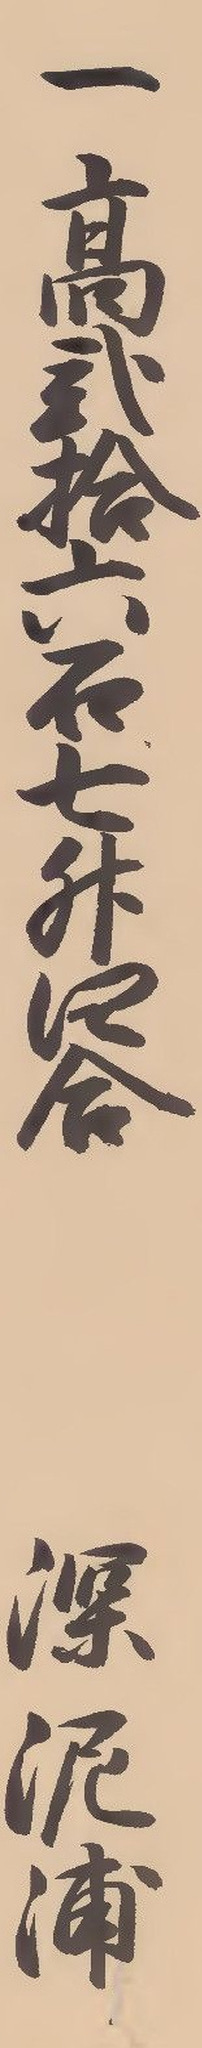一高弐拾六石七升四合深泥浦
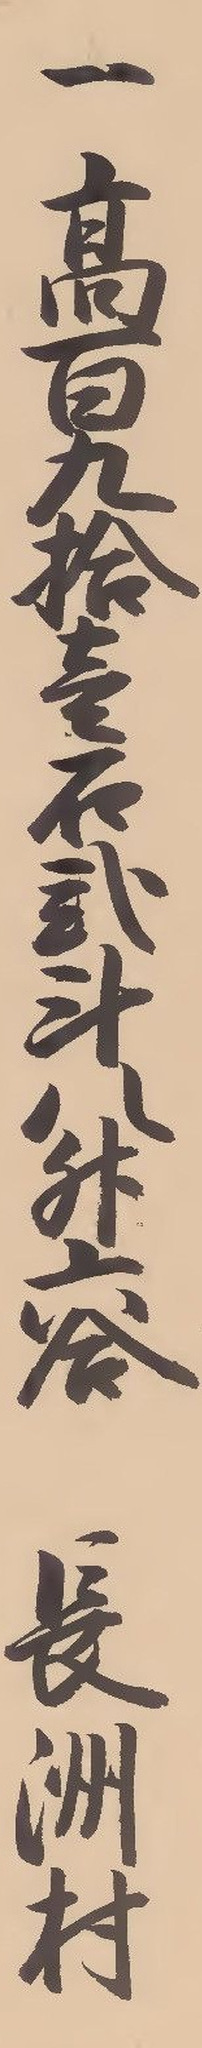一高百九拾壱石弐斗八升六合長洲村
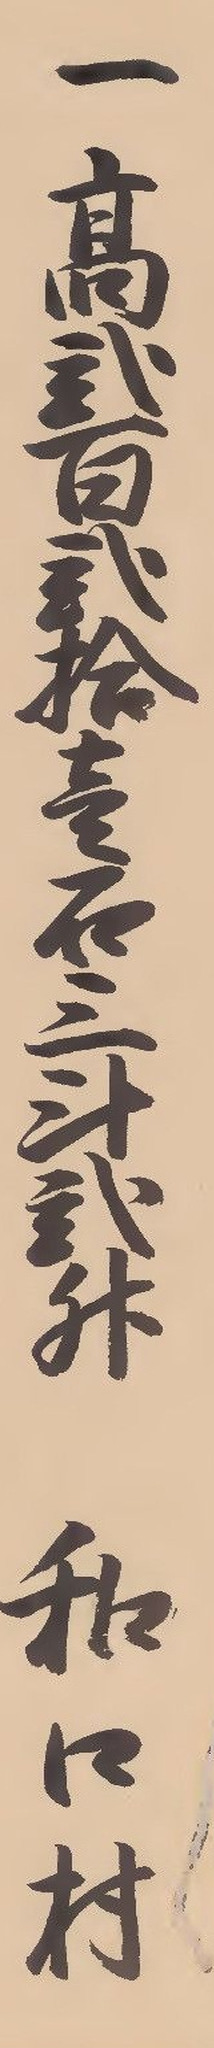一高弐百弐拾壱石三斗弐升和口村
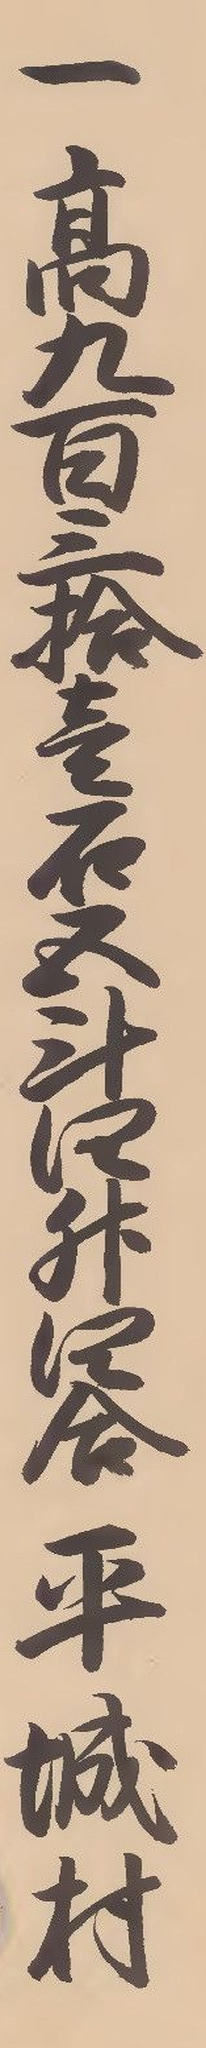一高九百三拾壱石五斗四升四合平城村
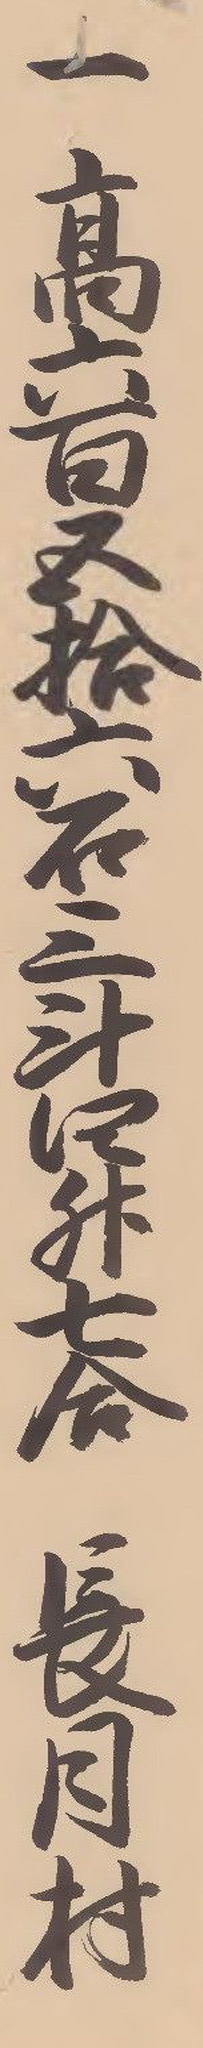一高六百五拾六石三斗四升七合長月村
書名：伊予国郷帳
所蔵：国立公文書館 National Archives of Japan
